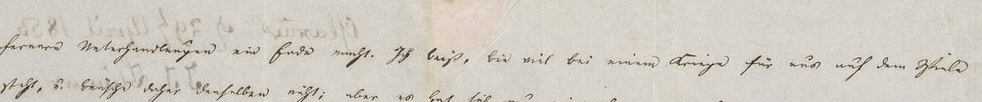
fernern Unterhandlungen ein Ende macht. Ich weiß, wie viel bei einem Kriege für uns auf dem Spiele
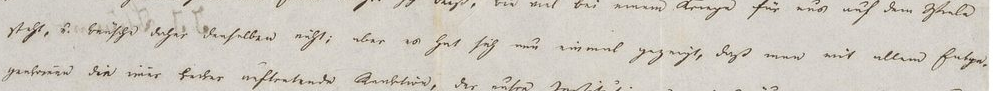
steht, u. wünsche daher denselben nicht; aber es hat sich nun einmal gezeigt, daß man mit allem Entge-
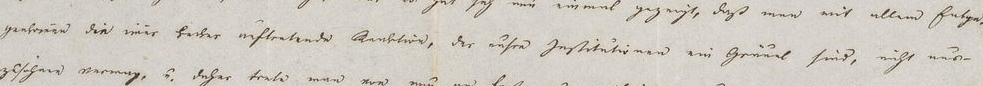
genkommen die immer kecker auftretende Reaktion, der unsre Institutionen ein Gräuel sind, nicht aus-
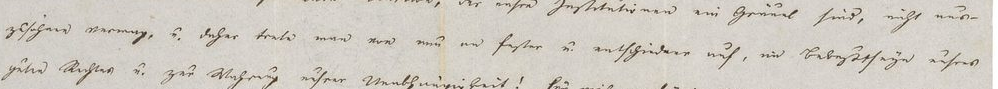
zusöhnen vermag, u. daher trete man von nun an fester u. entschiedener auf, im Bewußtseyn unsres
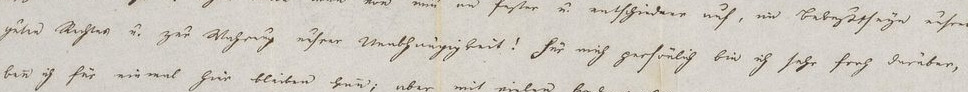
guten Rechtes u. zur Wahrung unsrer Unabhängigkeit! Für mich persönlich bin ich sehr froh darüber,
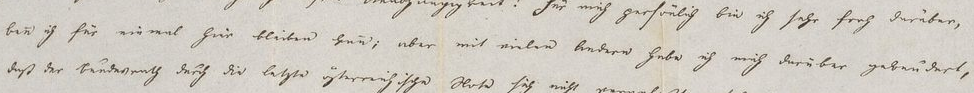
wenn ich für einmal hier bleiben kann; aber mit vielen Andern habe ich mich darüber gewundert,
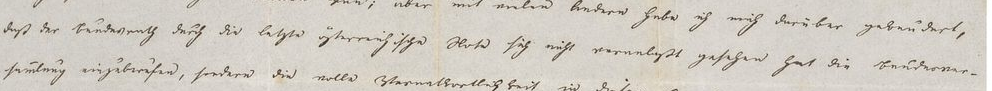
daß der Bundesrath durch die letzte österreichische Note sich nicht veranlaßt gesehen hat die Bundesver-
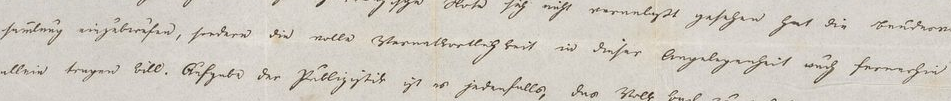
sammlung einzuberufen, sondern die volle Verantwortlichkeit in dieser Angelegenheit auch fernerhin
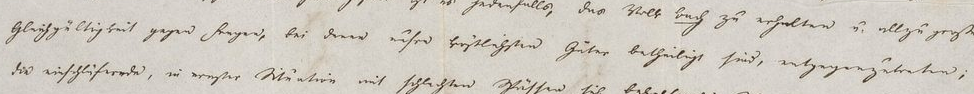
Gleichgültigkeit gegen Fragen, bei denen unsre köstlichsten Güter betheiligt sind, entgegenzutreten;
